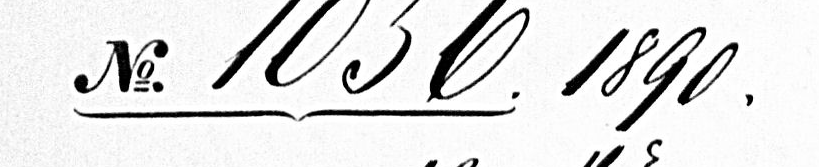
N° 1056. 1890.
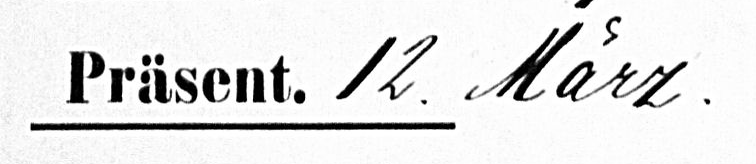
Präsent. 12. März.
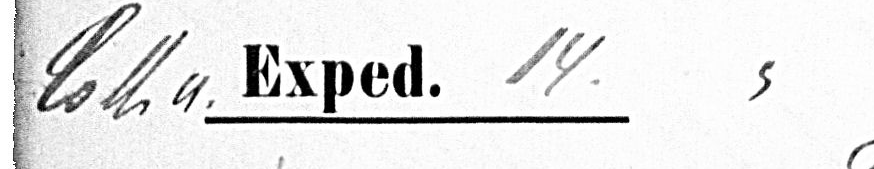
Coll. u. Exped. 14. März.
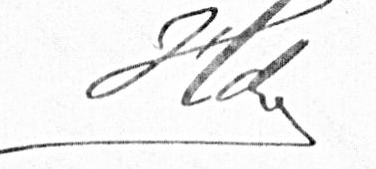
Hd
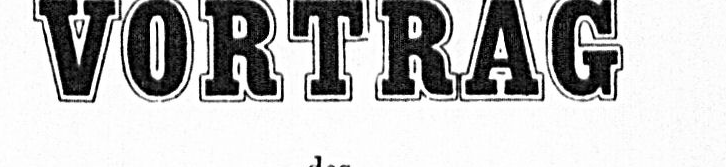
VORTRAG
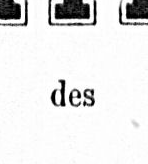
des
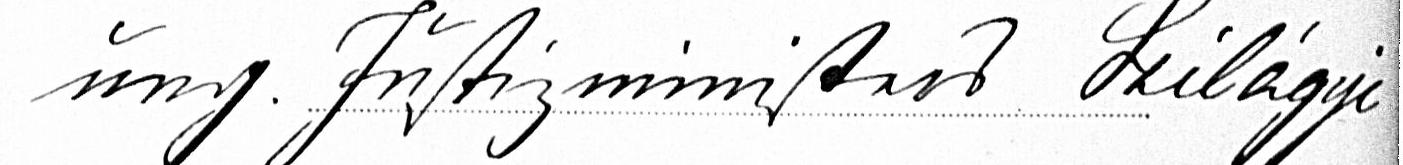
ung. Justizministers Seilágyi
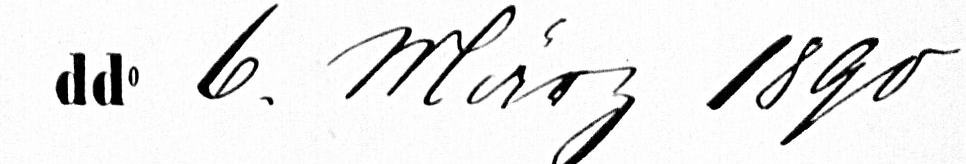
dd° 6. März 1890
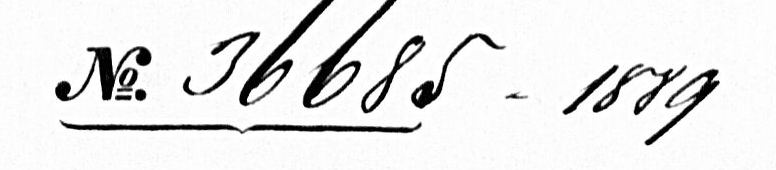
Nº 36685 - 1889
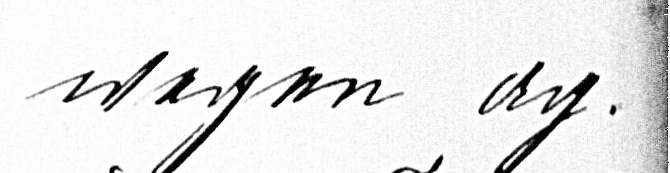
wegen ag.
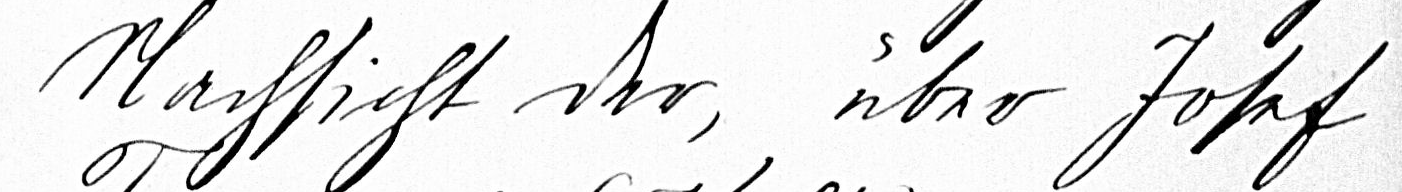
Nachsicht der, über Josef
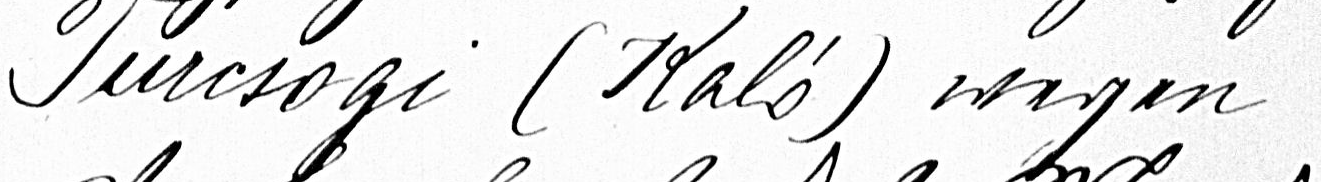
Turcsogi (Klaś) wegen
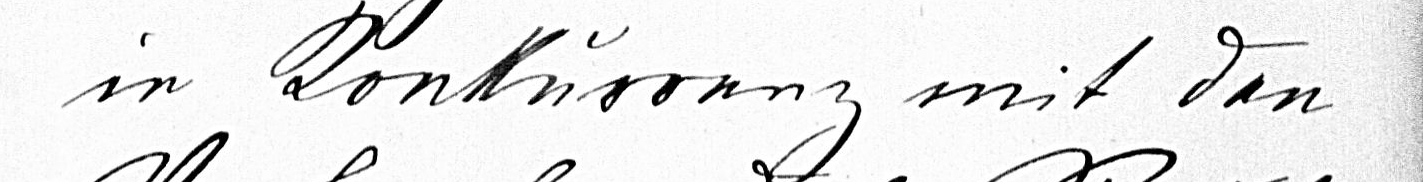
in Konkurrenz mit den
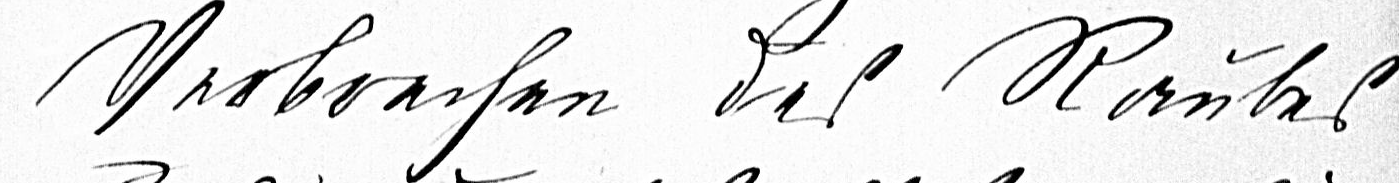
Verbrechen des Raubes
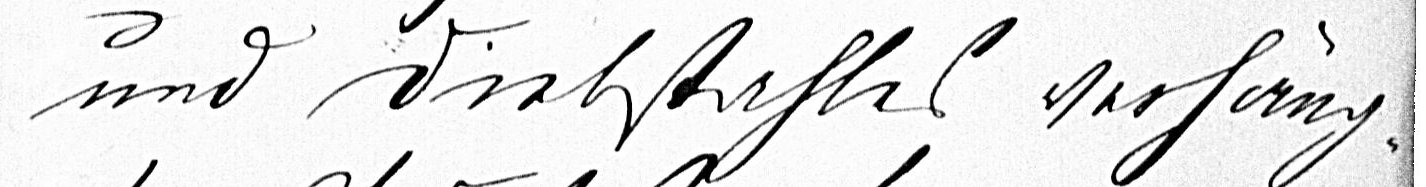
und Diebstahles verhäng¬
